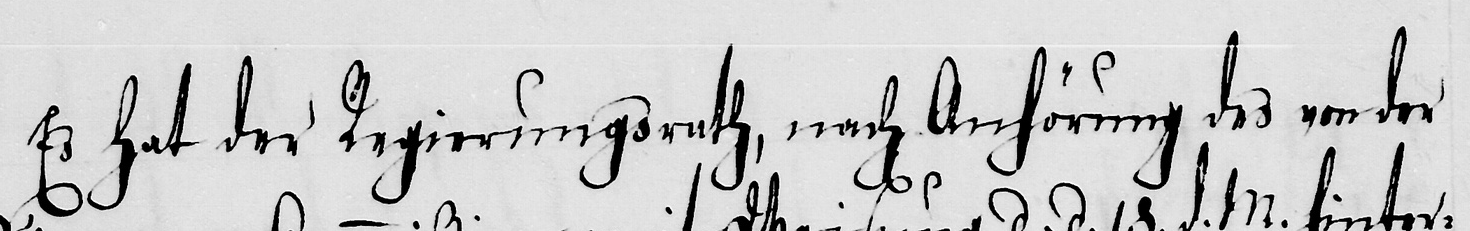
Es hat der Regierungsrath, nach Anhörung des von der
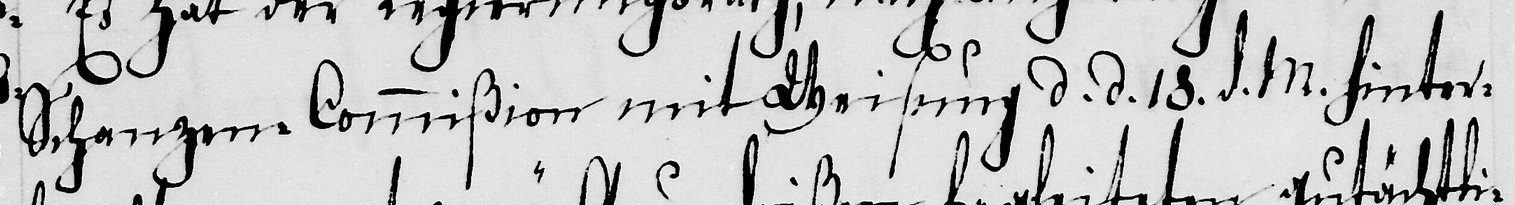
Schanzen-Commißion mit Weisung d.d. 18. d. M. hinter¬
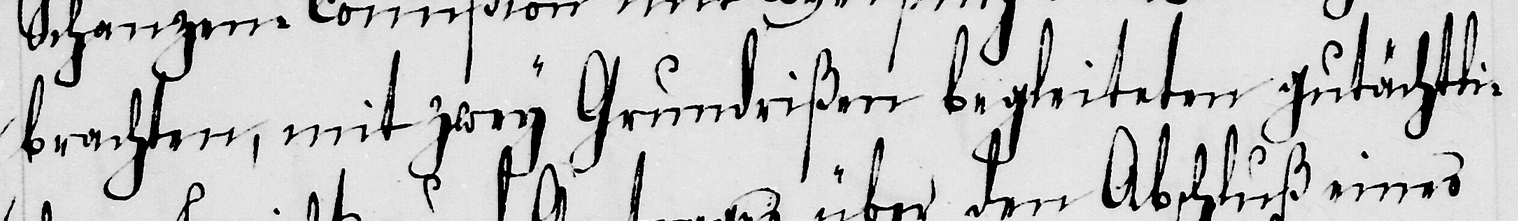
brachten, mit zwey Grundrißen begleiteten gutächtli¬
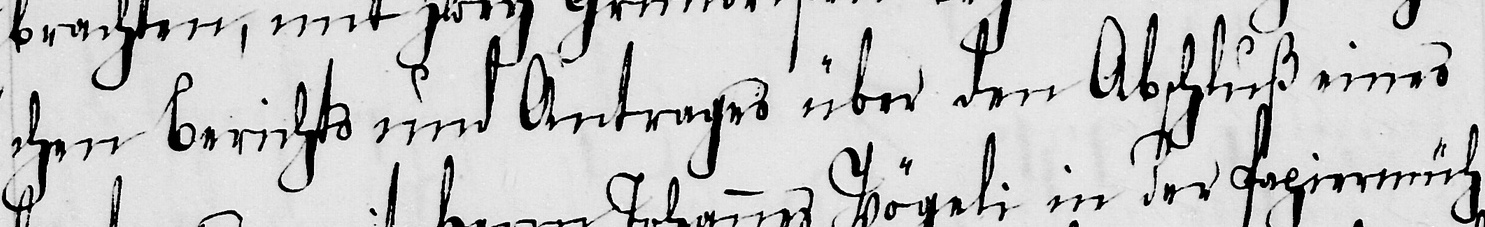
chen Berichts und Antrages über den Abschluß eines
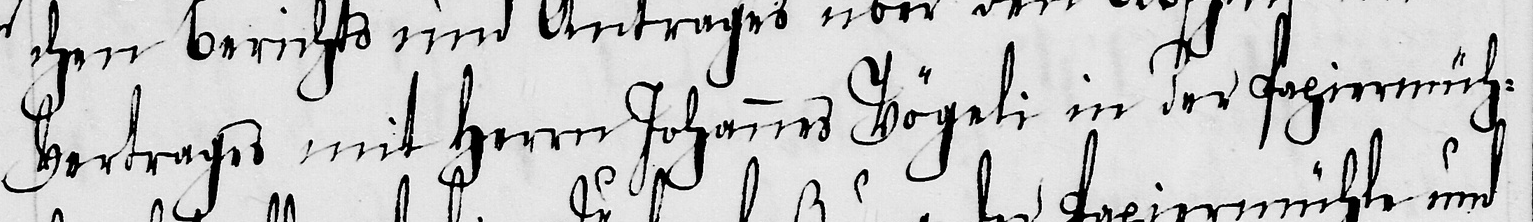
Vertrages mit Herrn Johannes Vögeli in der Papiermüh¬
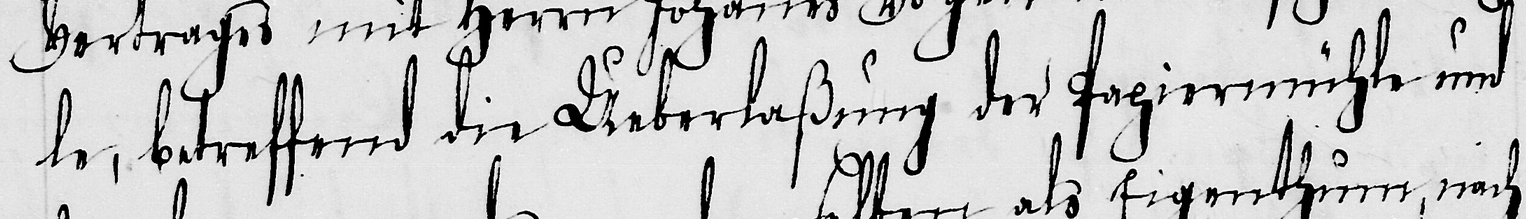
le, betreffend die Ueberlaßung der Papiermühle und
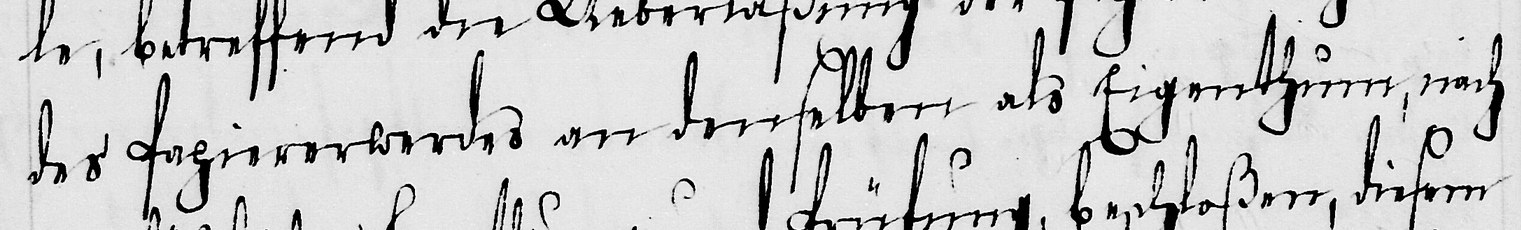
des Papiererwerdes an denselben als Eigenthum, nach
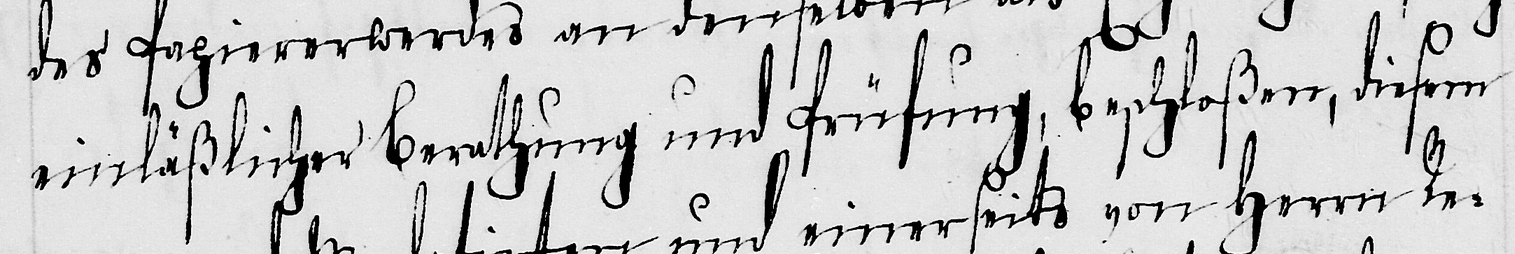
einläßlicher Berathung und Prüfung, beschloßen, diesem
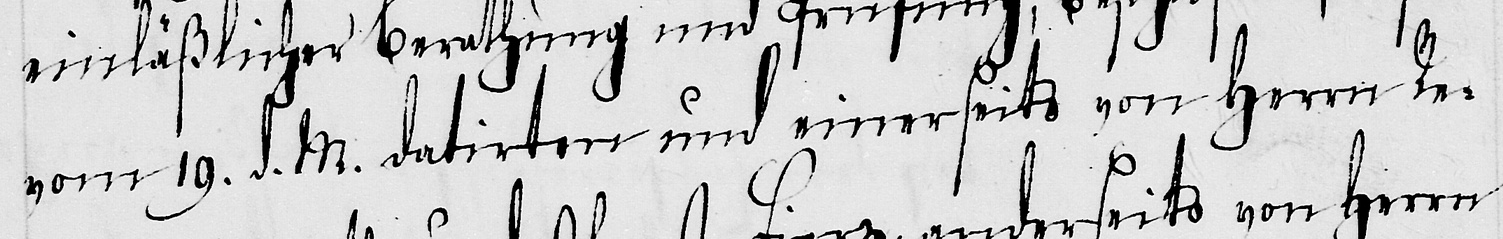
vom 19. d. M. datirten und einerseits von Herrn Re¬
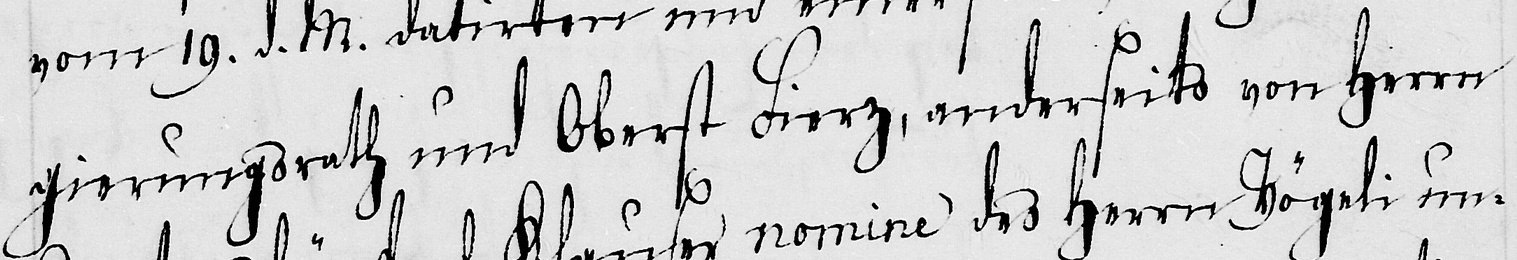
gierungsrath und Oberst Fierz, anderseits von Herrn
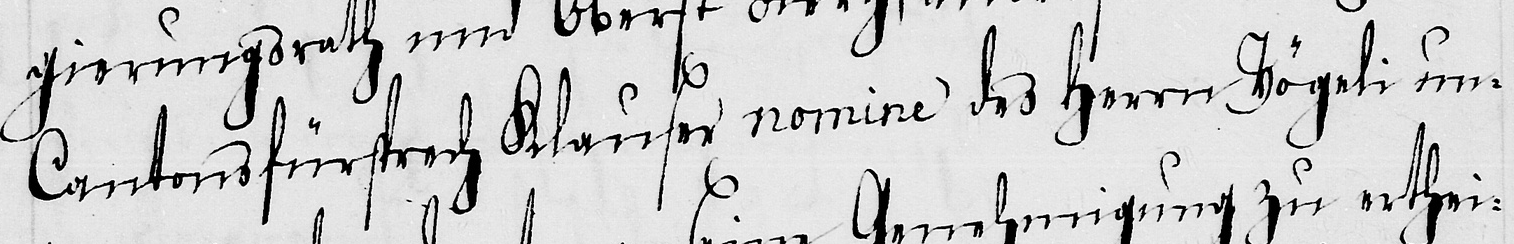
Cantonsfürsprech Klauser nomine des Herrn Vögeli un¬
